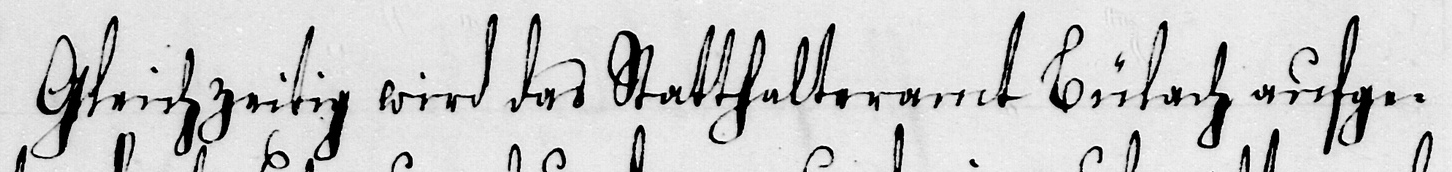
Gleichzeitig wird das Statthalteramt Bülach aufge¬
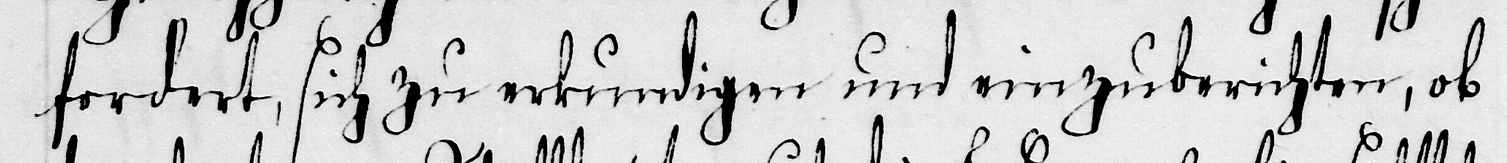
fordert, sich zu erkundigen und einzuberichten, ob
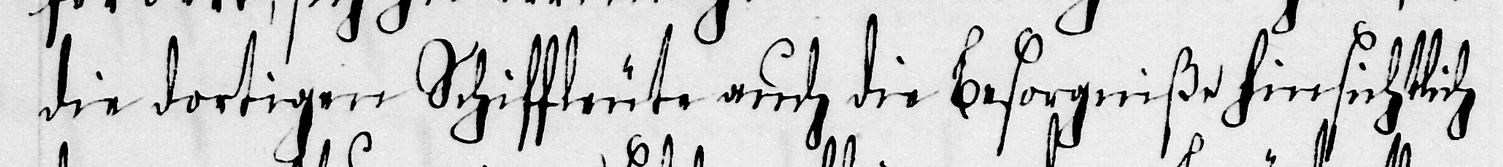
die dortigen Schiffleute auch die Besorgniße hinsichtlich
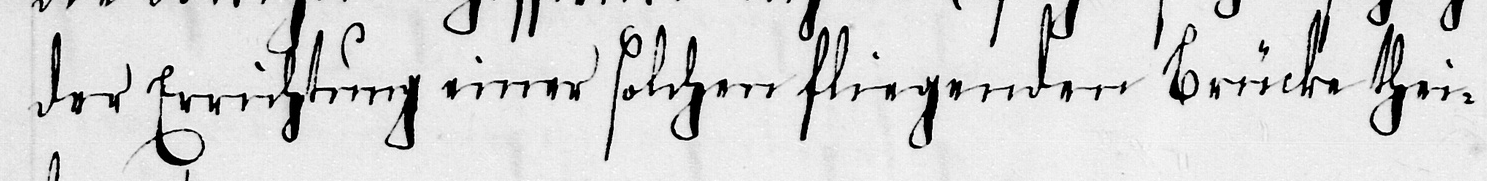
der Errichtung einer solchen fliegenden Brücke thei¬
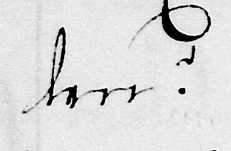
len?
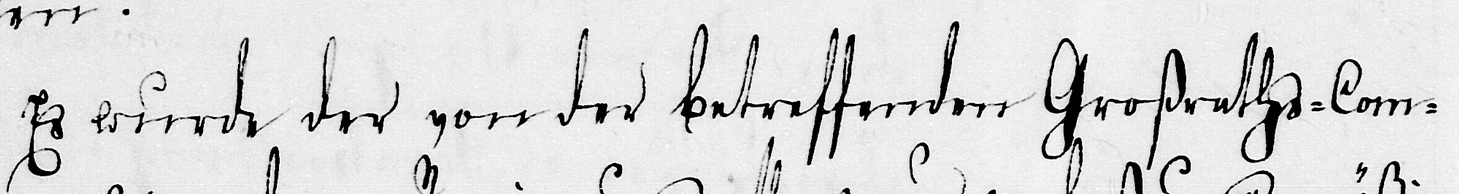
Es wurde der von der betreffenden Großraths-Com¬
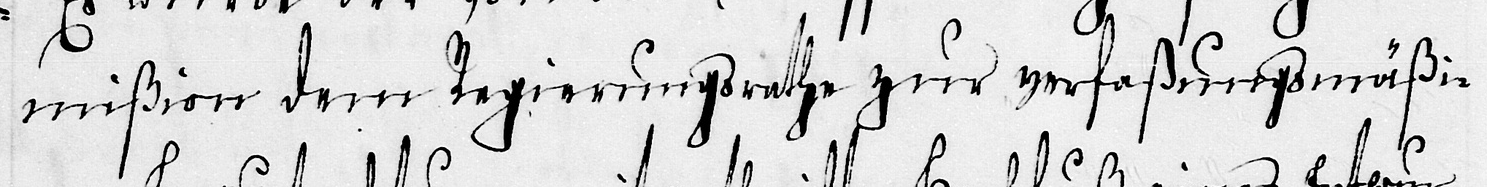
mißion dem Regierungsrathe zur verfaßungsmäßi¬
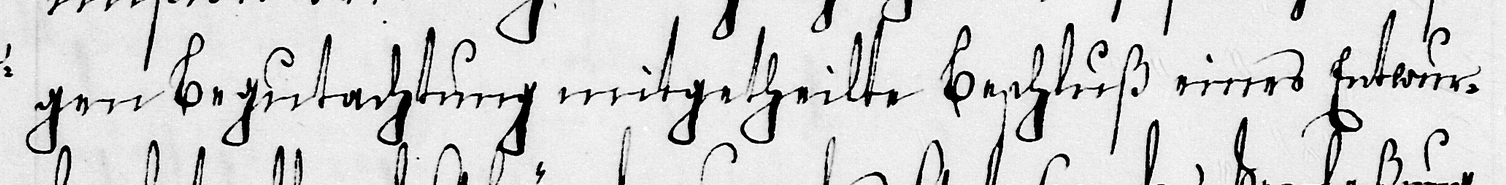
gen Begutachtung mitgetheilte Beschluß eines Entwur¬
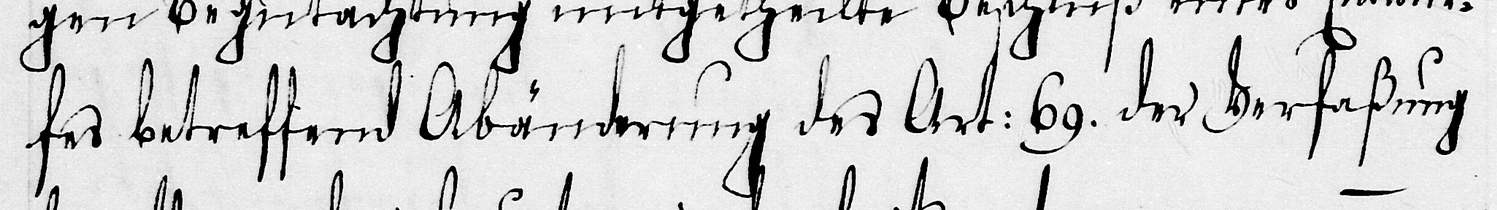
fes betreffend Abänderung des Art: 69. der Verfaßung
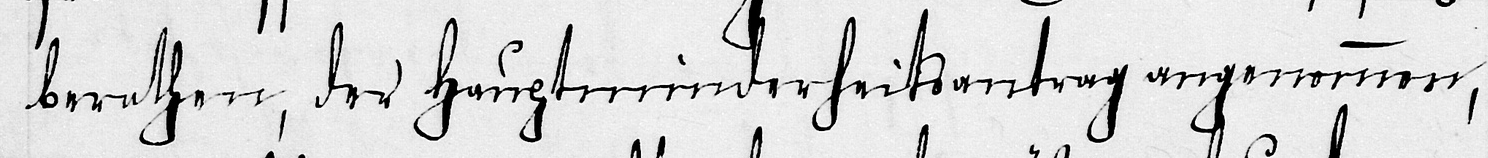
berathen, der Hauptminderheitsantrag angenommen,
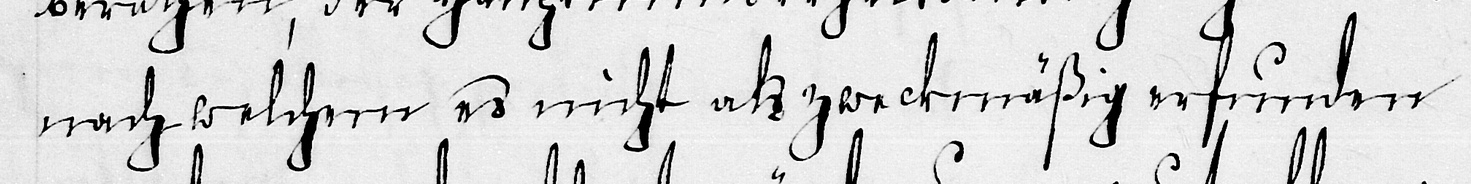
nach welchem es nicht als zweckmäßig erfunden
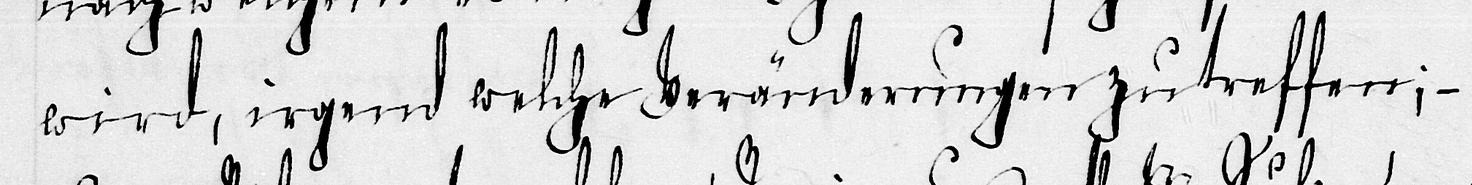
wird, irgend welche Veränderungen zu treffen; –
